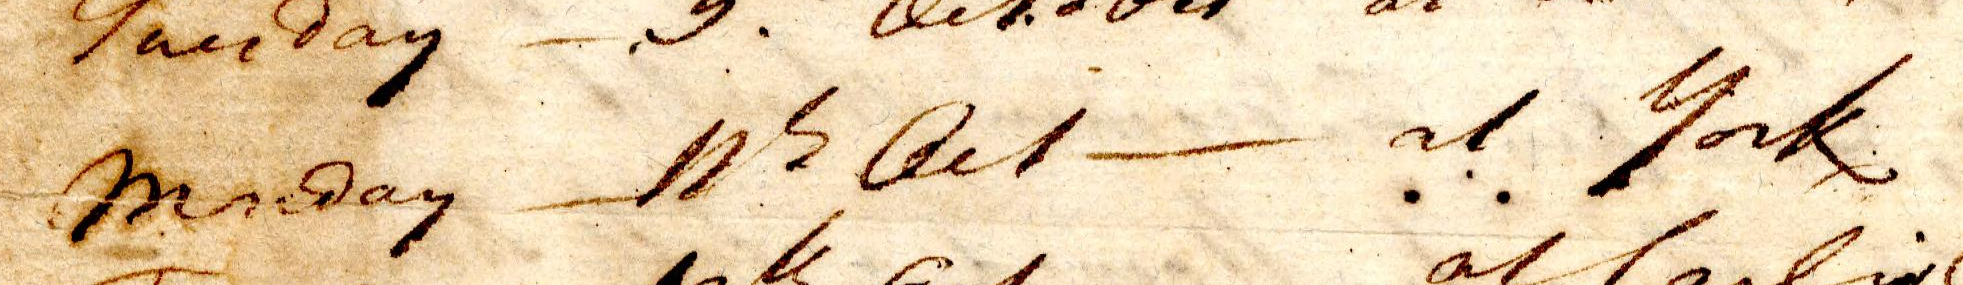Monday- 17^th. Oct- at York
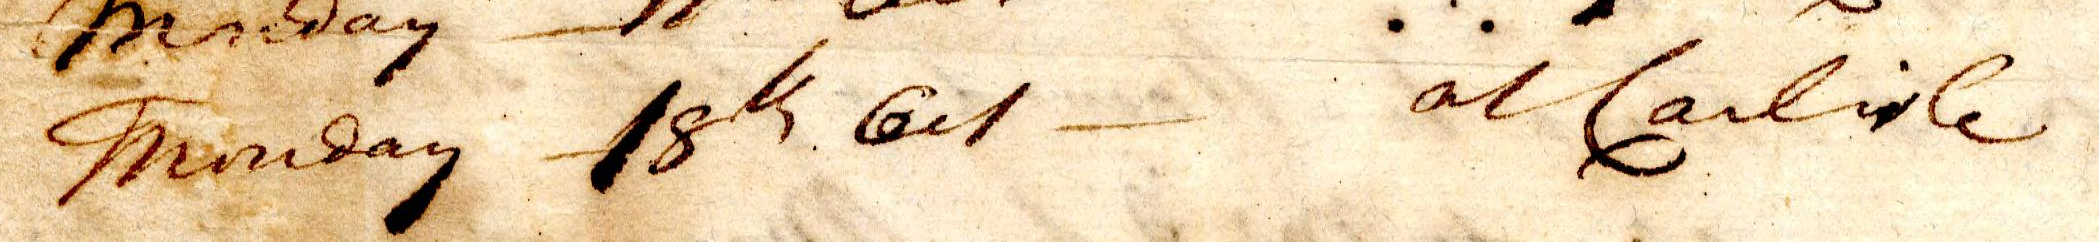Monday- 18^th Oct- at Carlisle
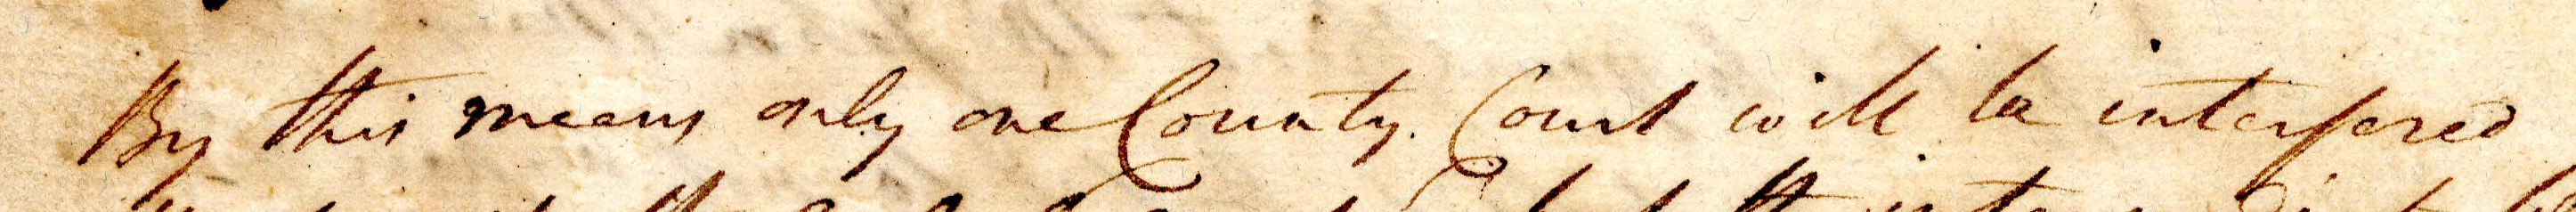By this means only one County Court will be interfored
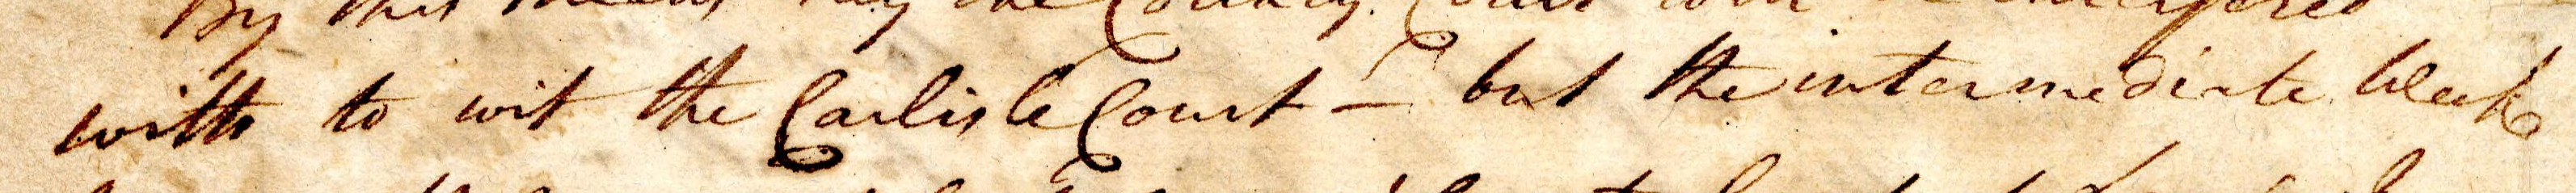with to wit the Carlisle Court, but the intermediate week
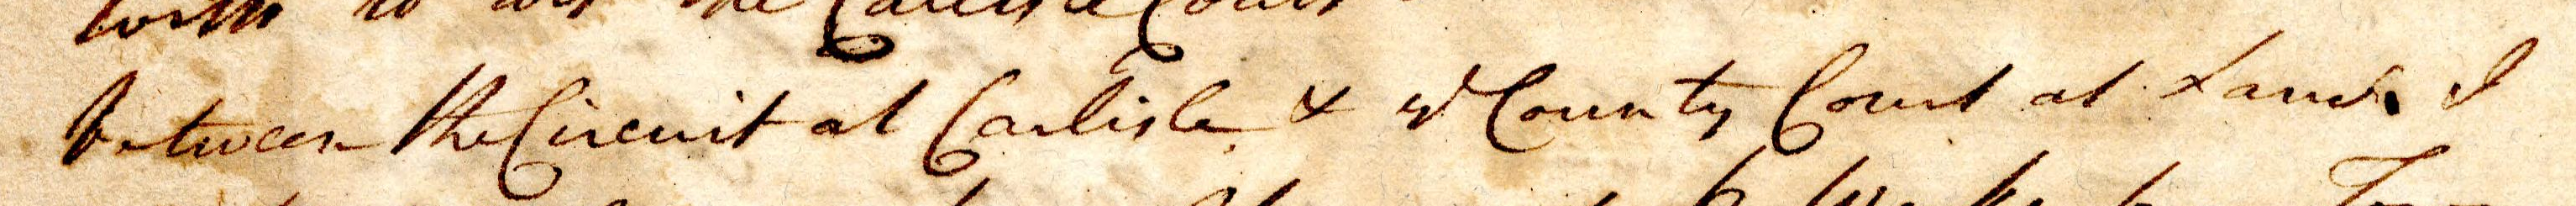between the Circuit at Carlisle, & y^e County Court at Lavel I
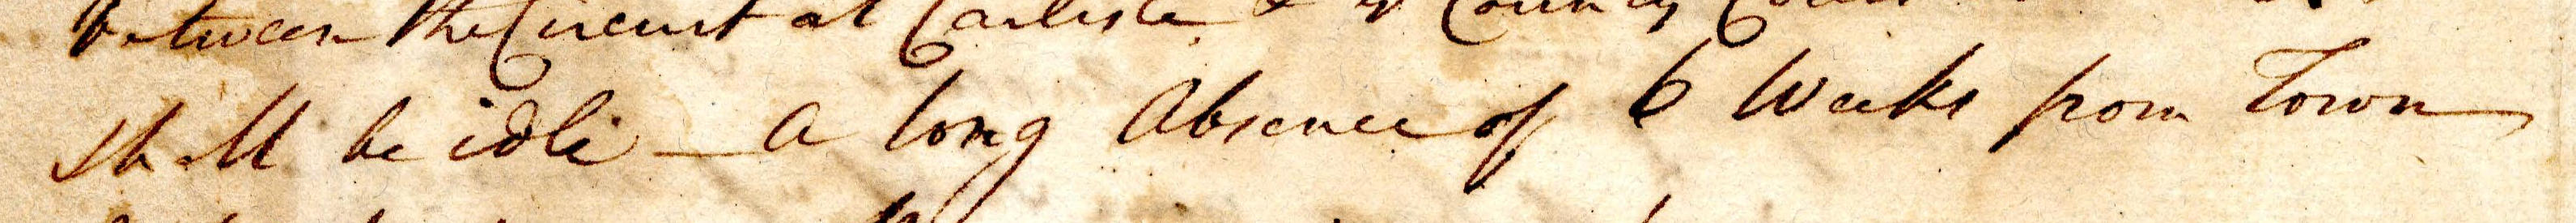shill be idle. A long Absence of 6 Weeks from Town
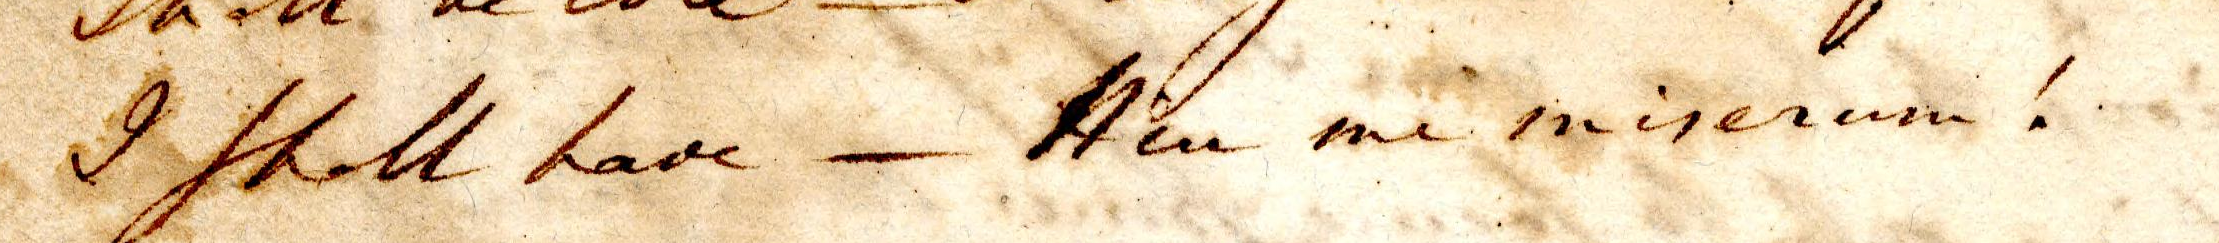I shall have. Hic me miserum!
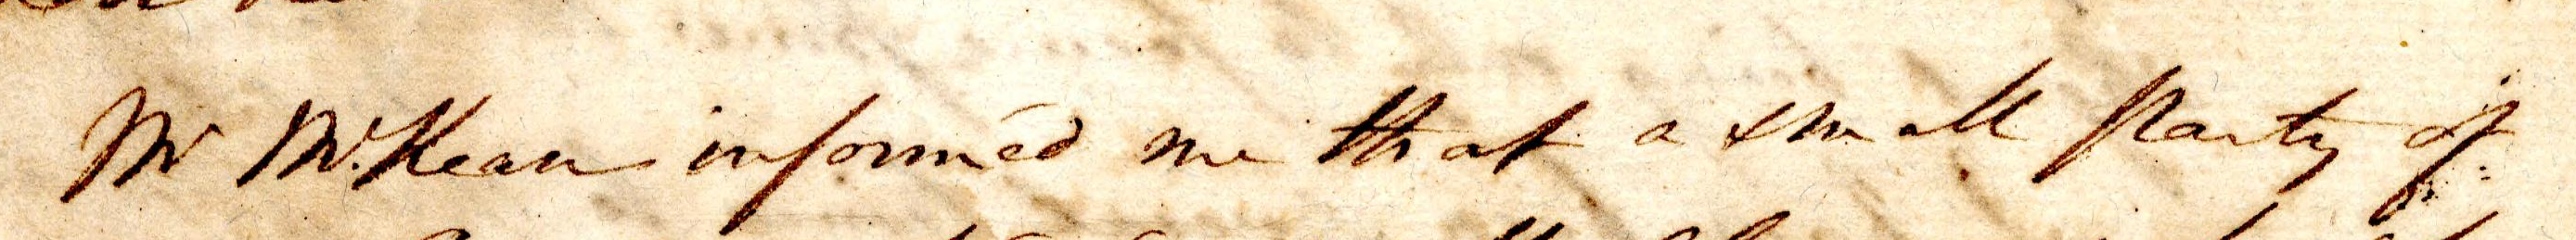M^r McKean informed me that a small party of
